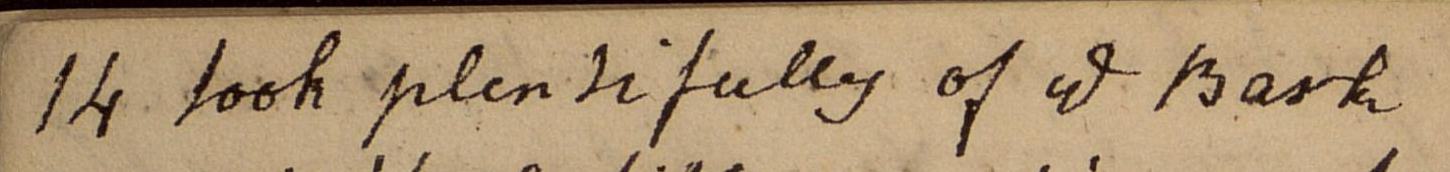14 took plentifully of y^e Bark
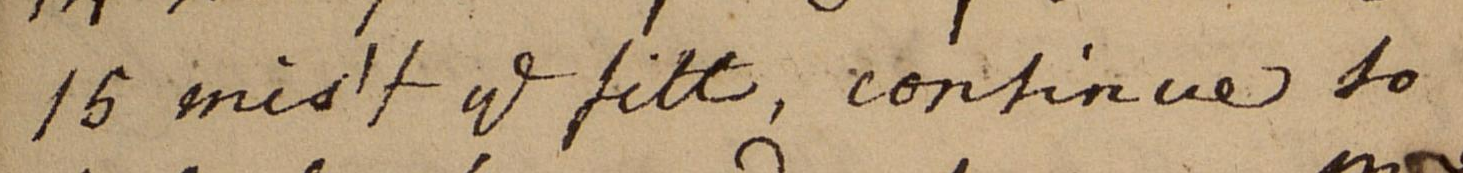15 mis't y^e fitt, continue to
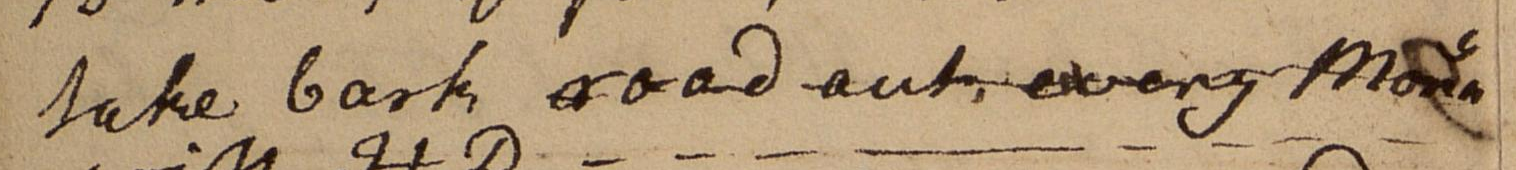take bark road out every Morn^g
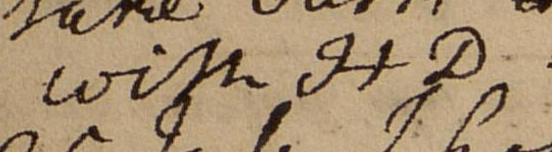with HD
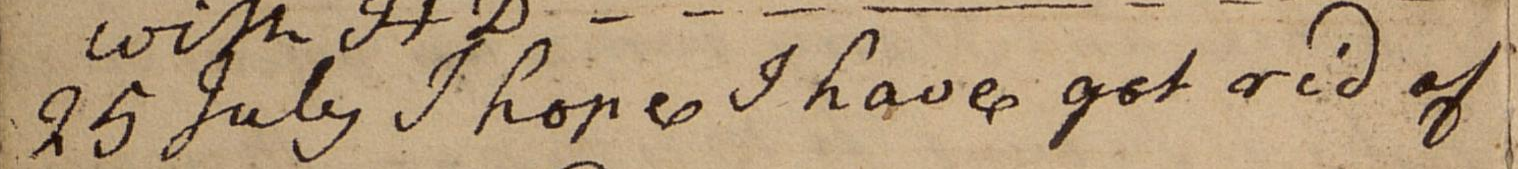25 July I hope I have get rid of
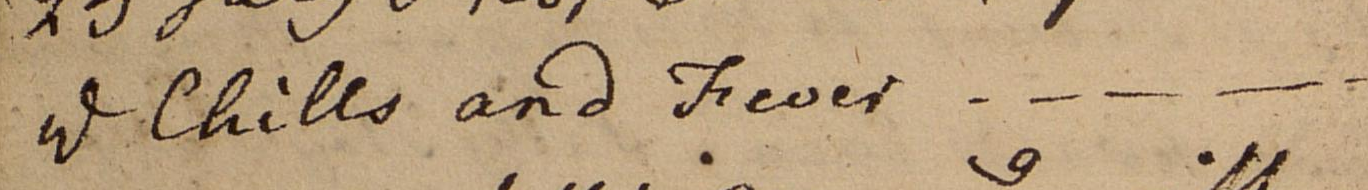y^e Chills and Fever-
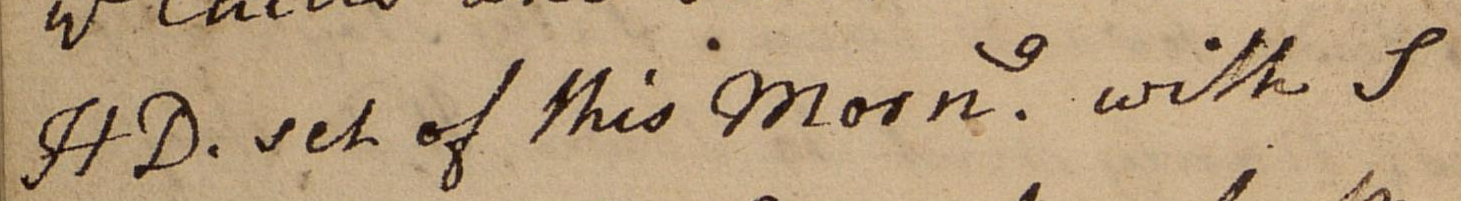H D. set of this Morn^g. with S
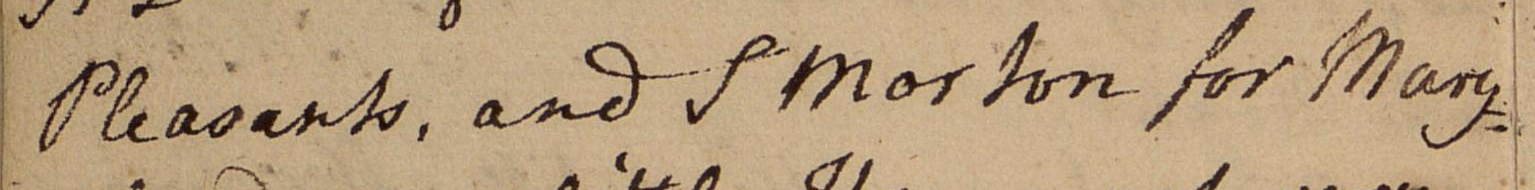Pleasants, and S Morton for Mary-
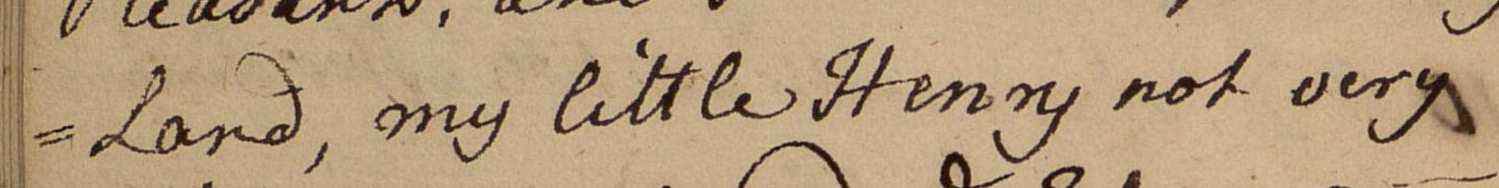-Land, my little Henry not very
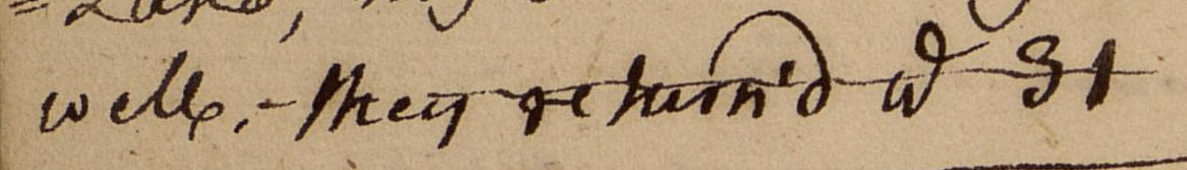well,- they return'd y^e 31
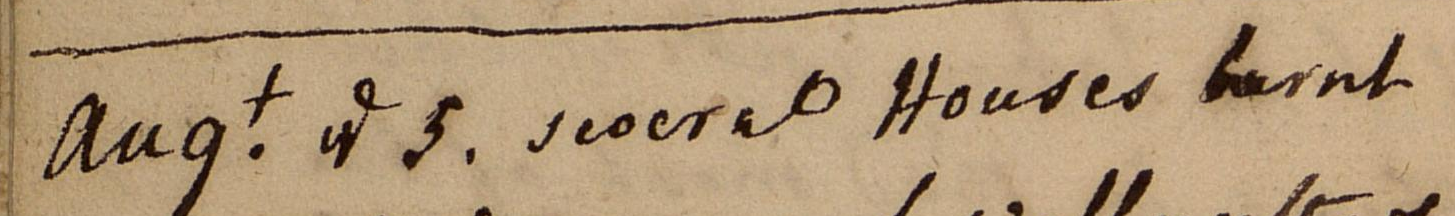Aug^t y^e 5. several Houses burnt
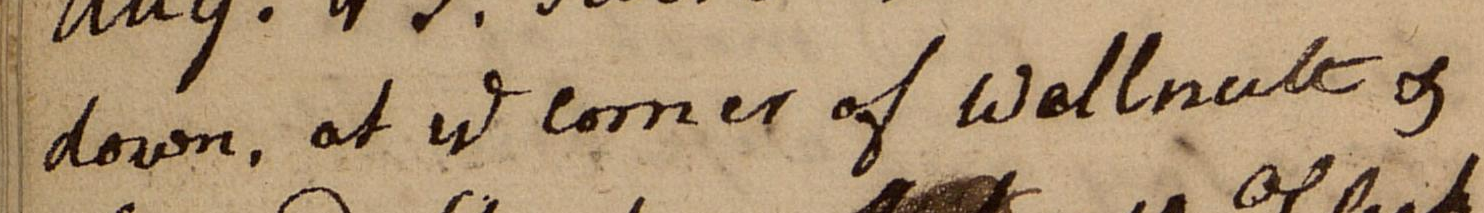down, at y^e corner of Wallnult &
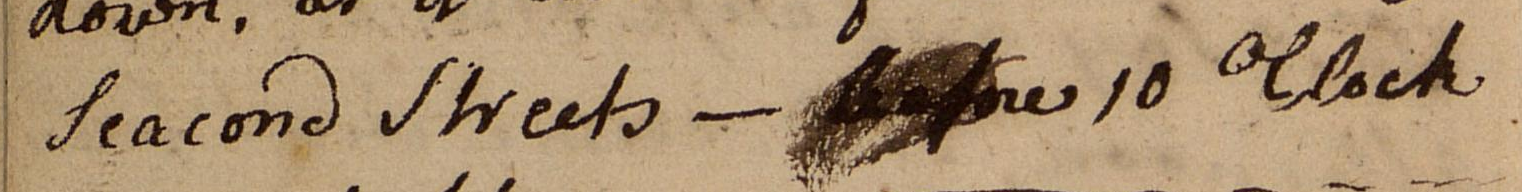Seacond Streets- before 10 ^o Clock
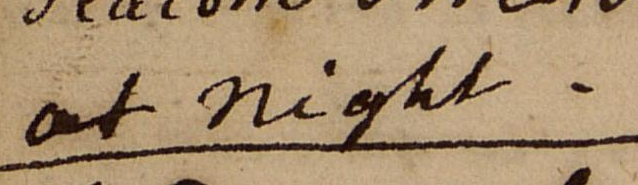at night.
